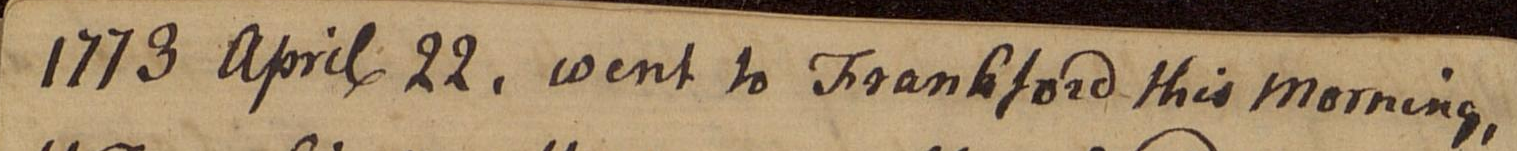1773 April 22. went to Frankford this morning,
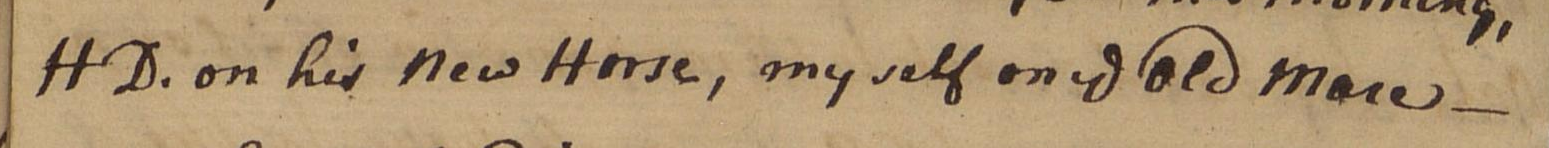HD. on his New Horse, my self on y^e Old Mare-
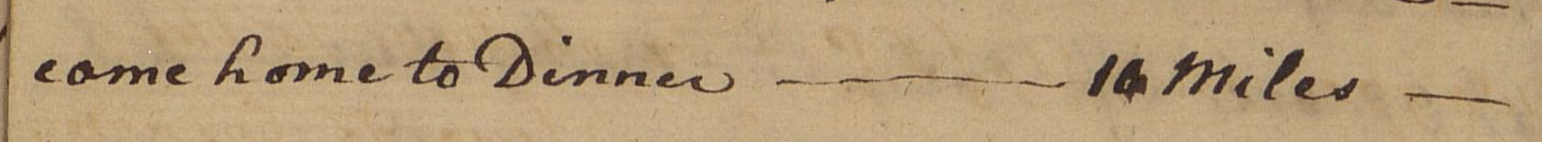came home to Dinner- 10 Miles-
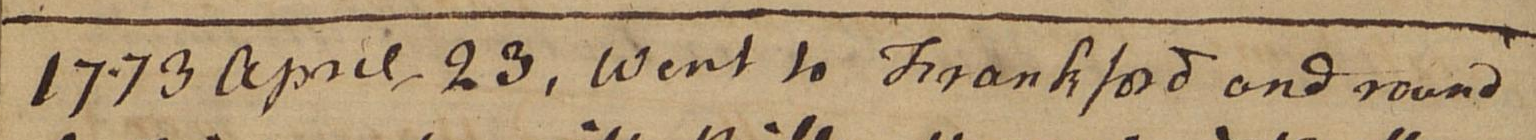1773 April 23, went to Frankford and round
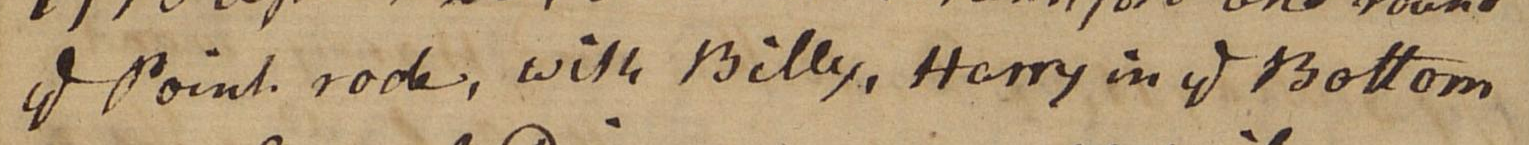y^e Point rode, with Billy, Henry in y^e Bottom
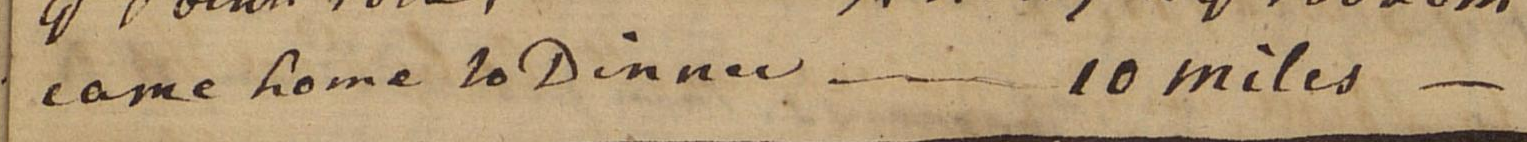came home to Dinner- 10 Miles-
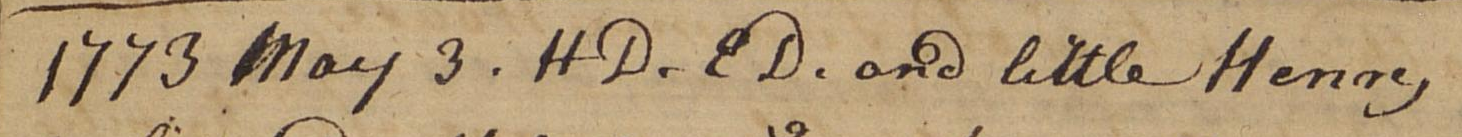1773 May 3. HD. ED. and little Henry,
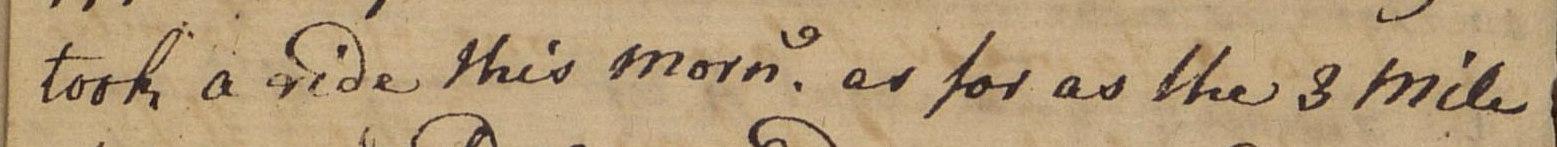took a ride this morn^g. as for as the 3 Mile
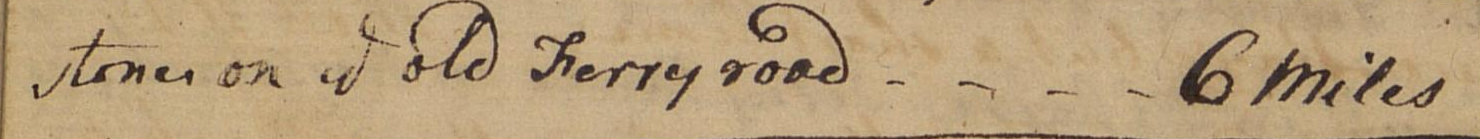stone on y^e old Ferry road---- 6 Miles
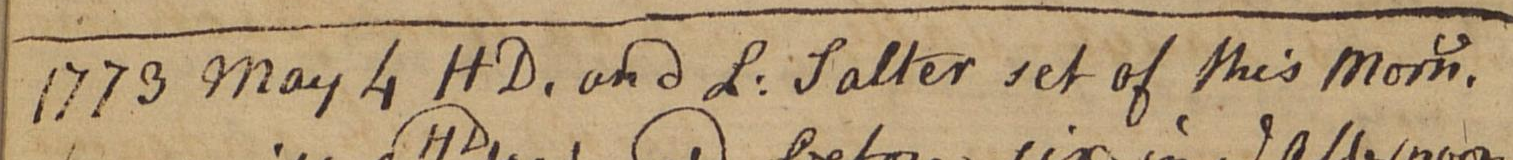1773 May 4 HD, and L: Salter set of this morn^g.
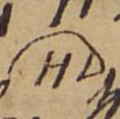HD
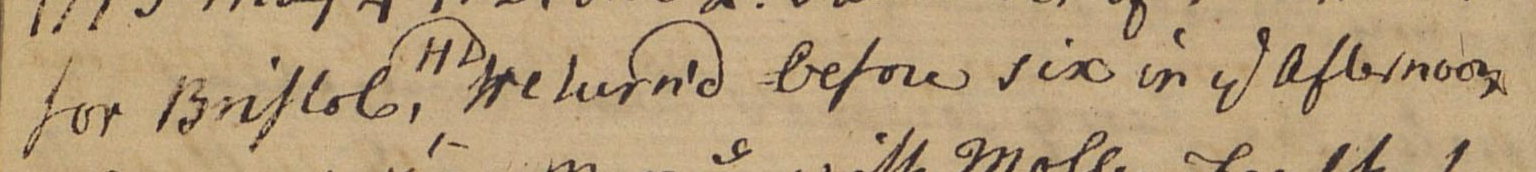for Bristol, ^ return'd before six in y^e Afternoon
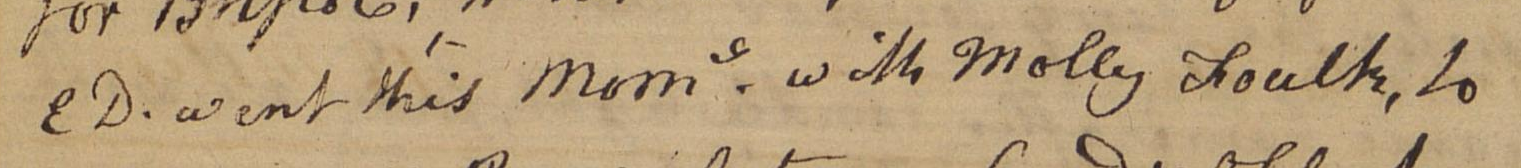ED. went this Morn^g. with Molly Foulk, to
